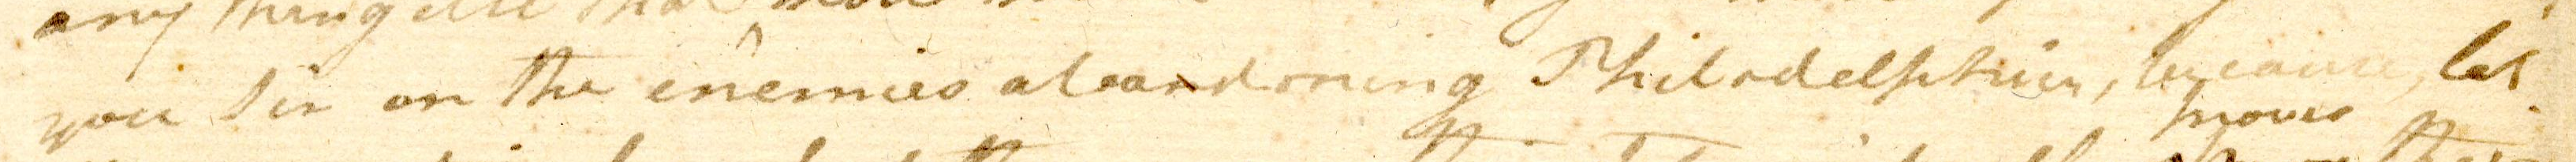you sir on the enemies abandoning Philadelphia, because let
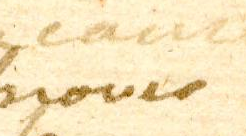your
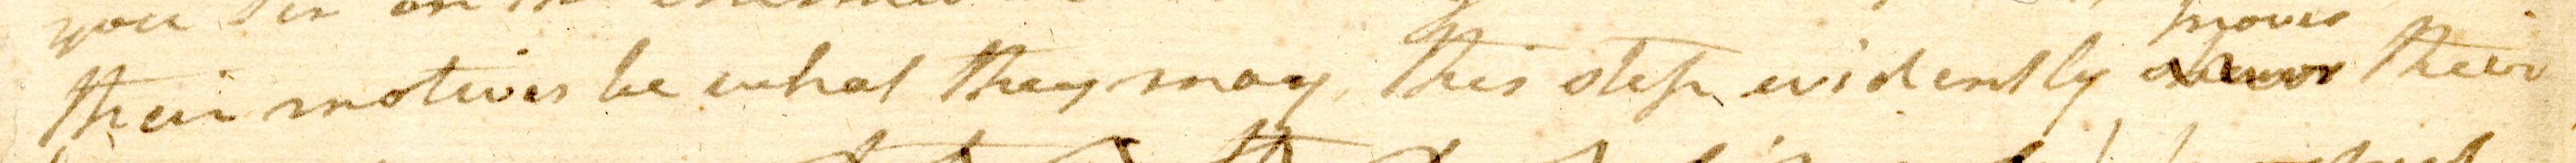their motives be what they may This step evidently [___] their
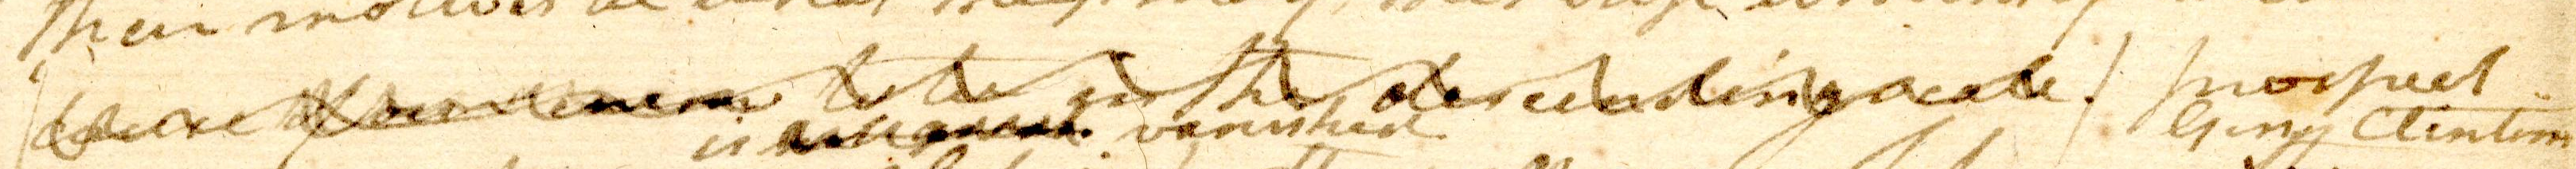[____________________________] / prospect
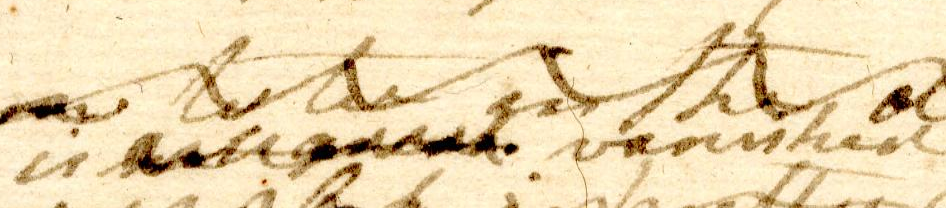is [______ vanished
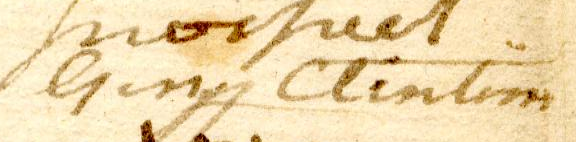Gen Clinton
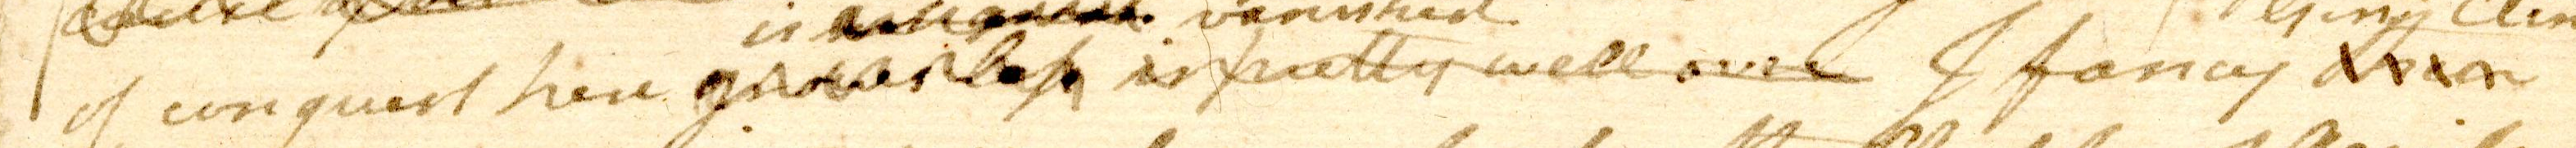of conquest here [______] [______] well over I fancy [____]
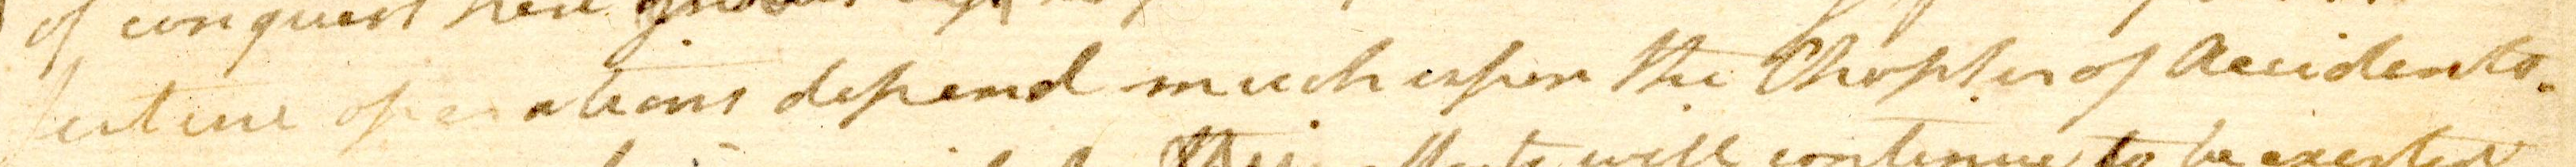future operations depend much upon the Chapter of Accidents,
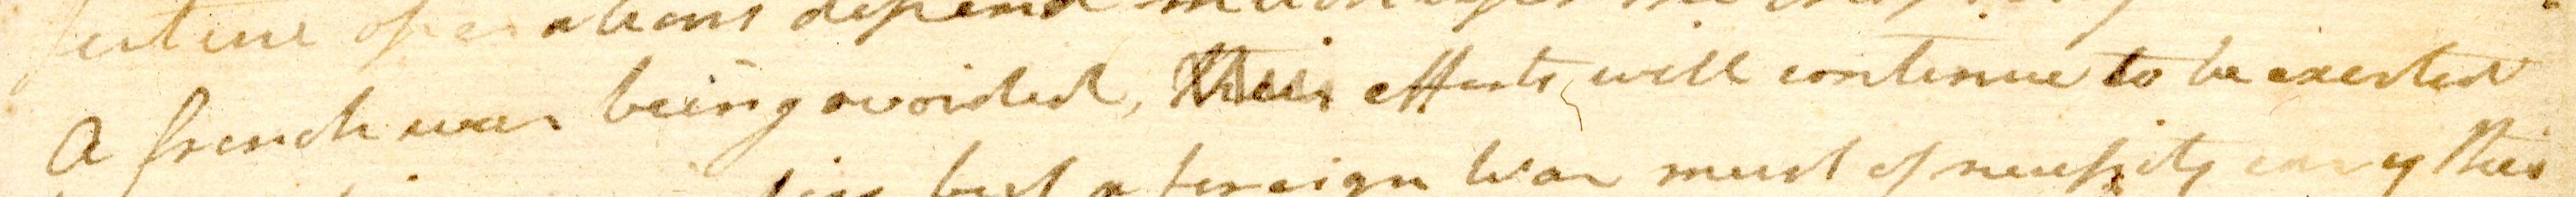a frenchmen being avoided, [Their] effects will continue to be exerted
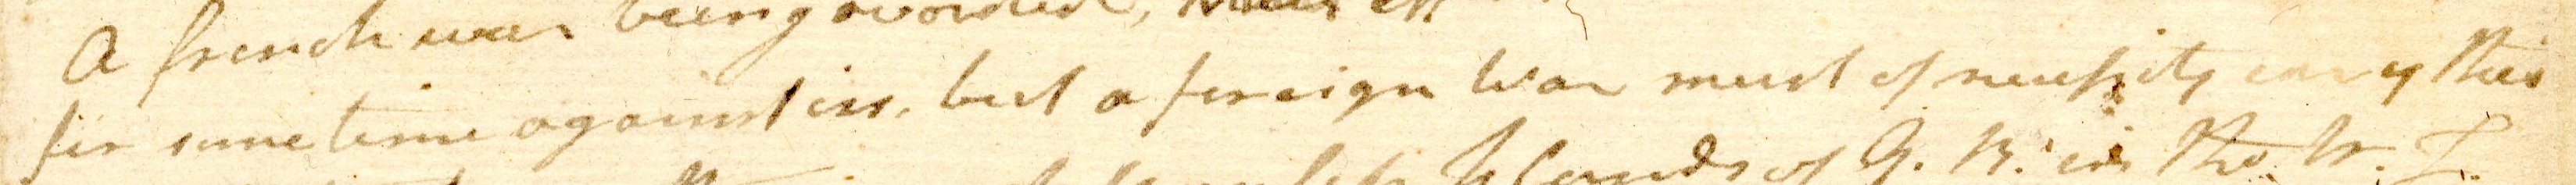for some time against us but a foreign war must of necessity envy this
